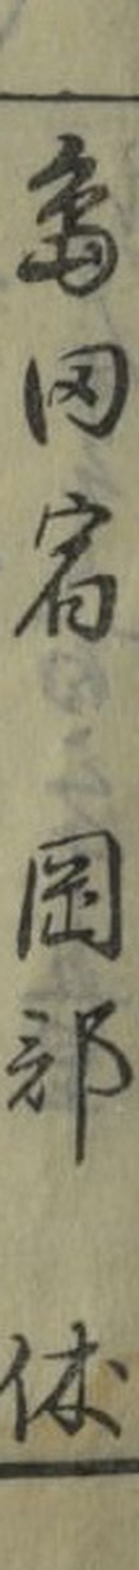島田宿岡部休
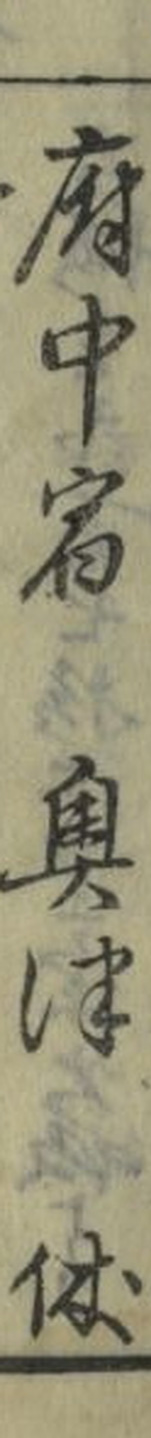府中宿奥津休
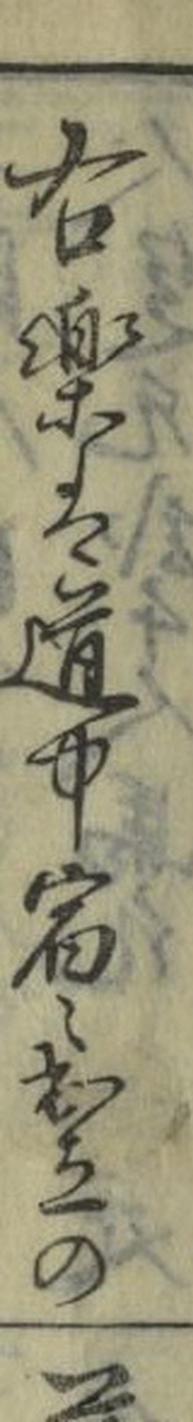右樂は道中宿々出立の
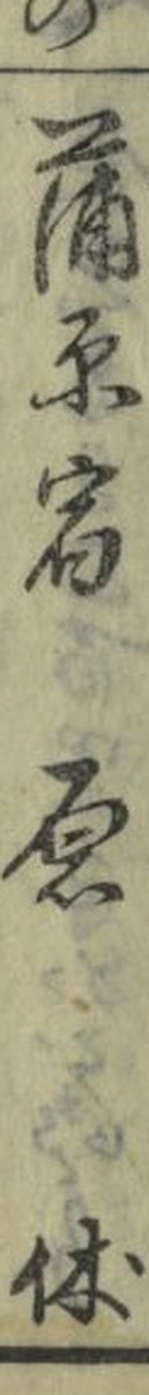蒲原宿原休
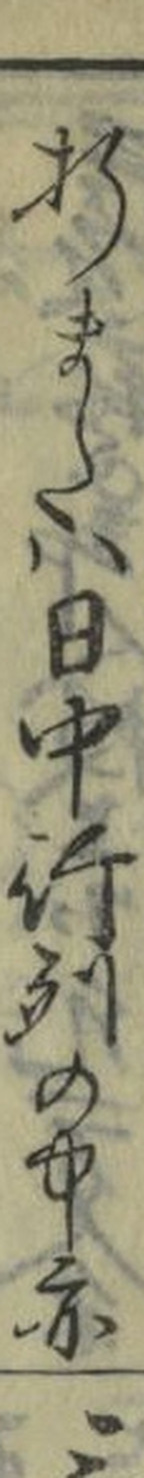折または日中行列の中亦
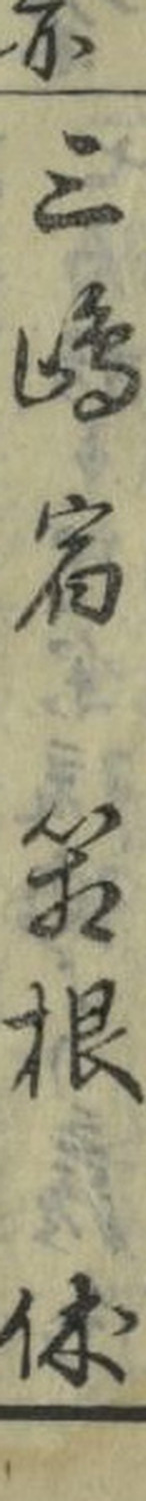三崎宿箱根休
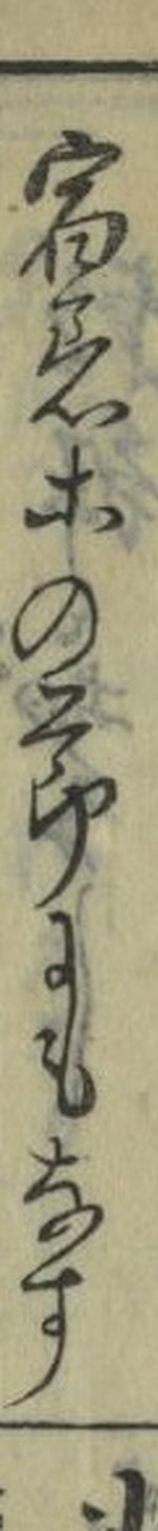宿着等の節にもなす
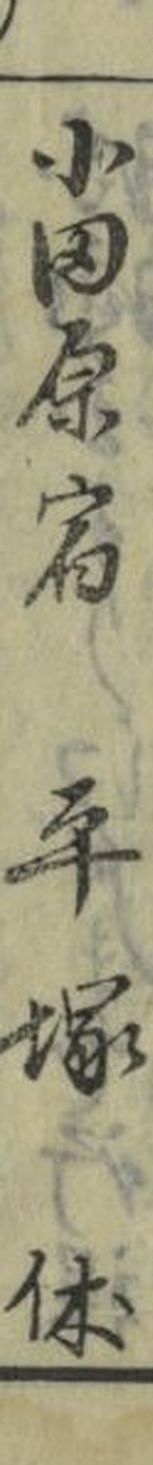小田原宿平塚休
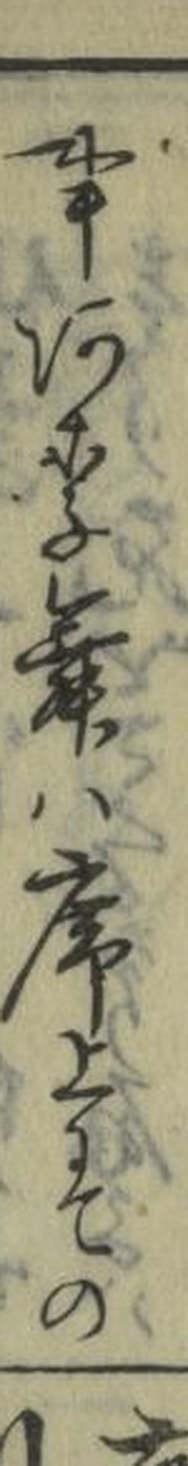事あり舞は席上にての
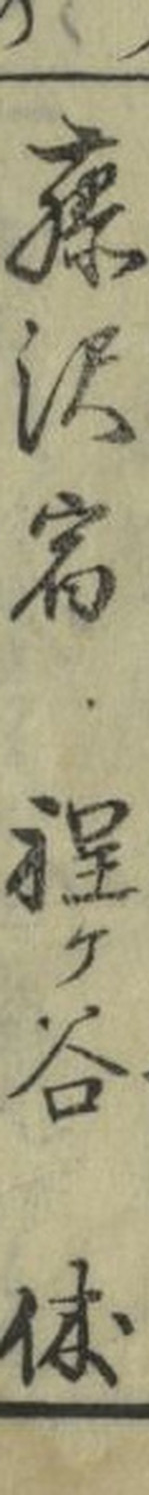藤沢宿程ヶ谷休
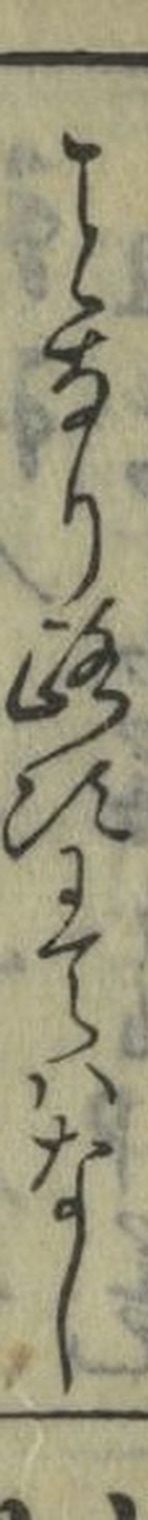ことなり路次にてはなし
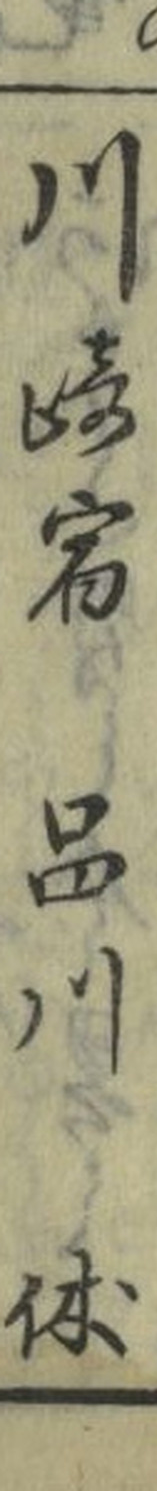川崎宿品川休

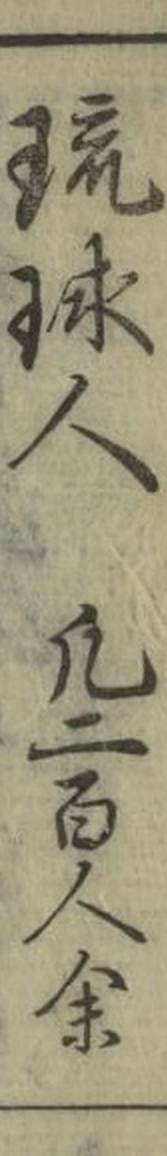琉球人凡二百人余
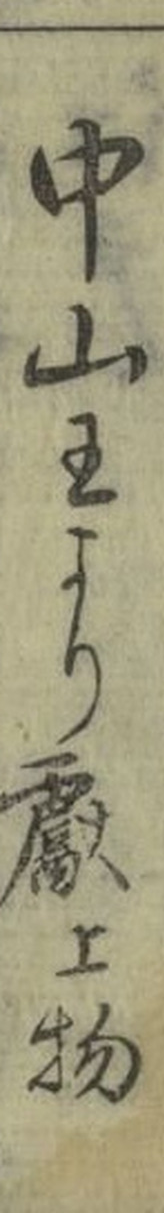中山王より獻上物
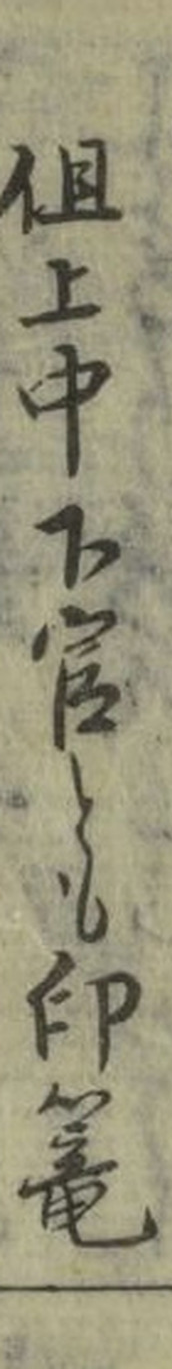但上中下官とも印篭
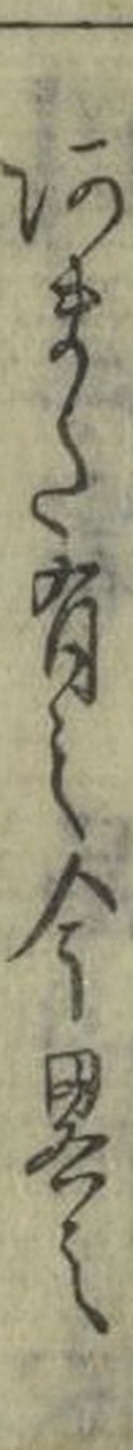あまた有之今略之
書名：新板 琉球人行列記
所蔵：University of the Ryukyus Library
